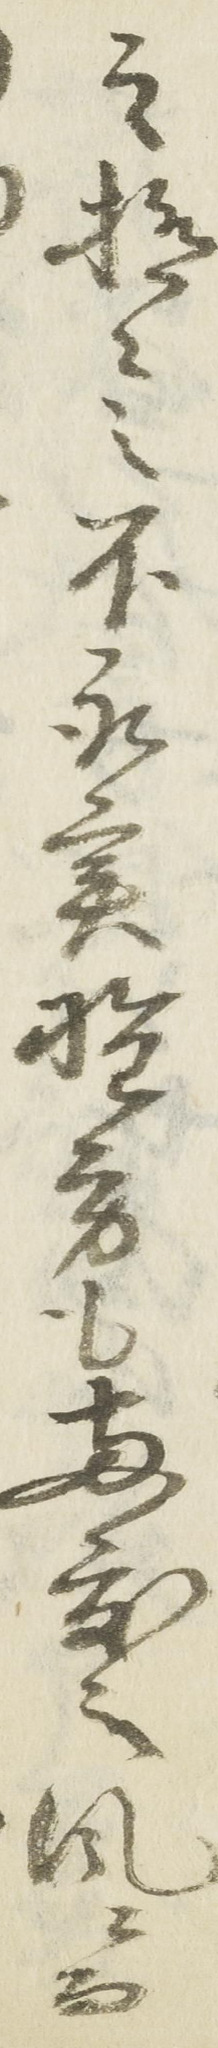之極々之不取実野方も両度之風ニ而
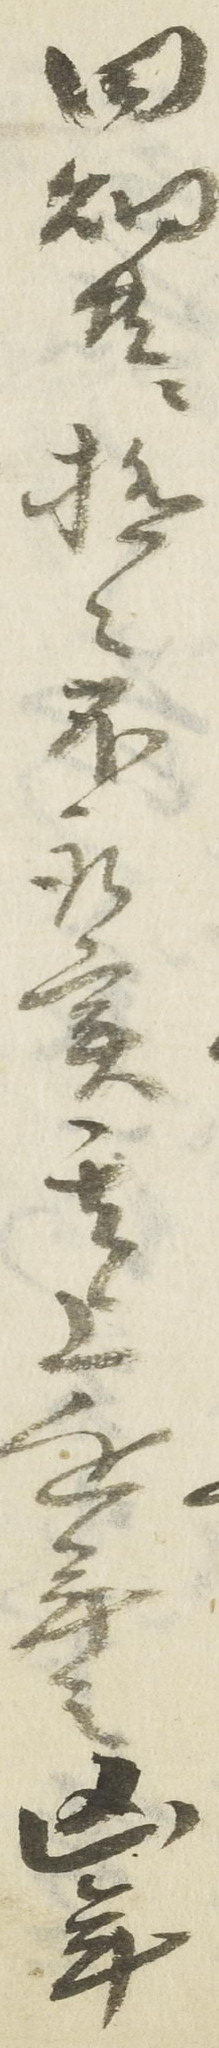田畑共ニ極々不取実其上近年之凶年
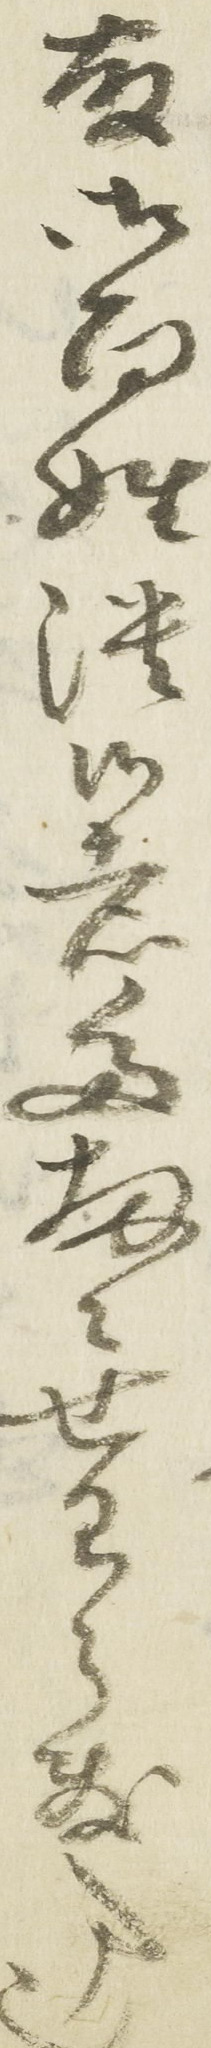故御百姓潰候者多扨々せわら敷事也
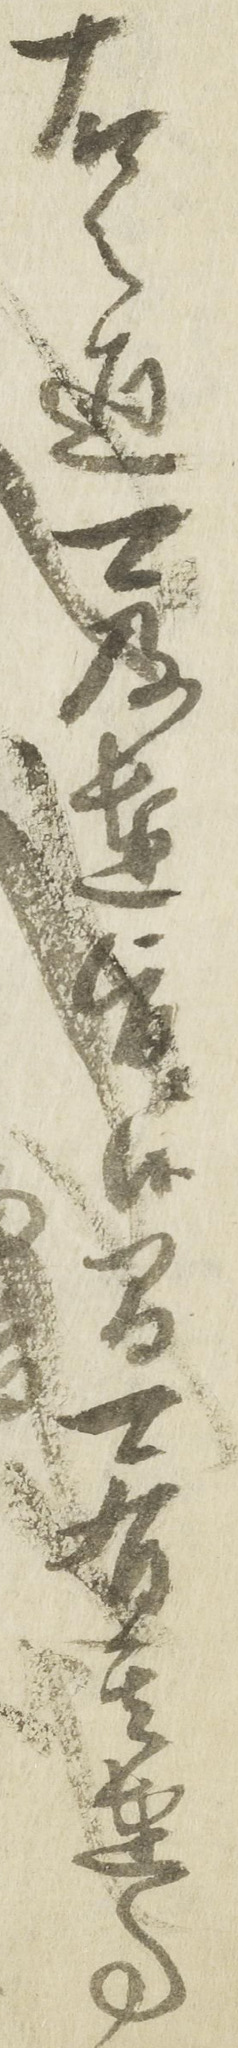右の通可及達旨ニ候間可有其達事
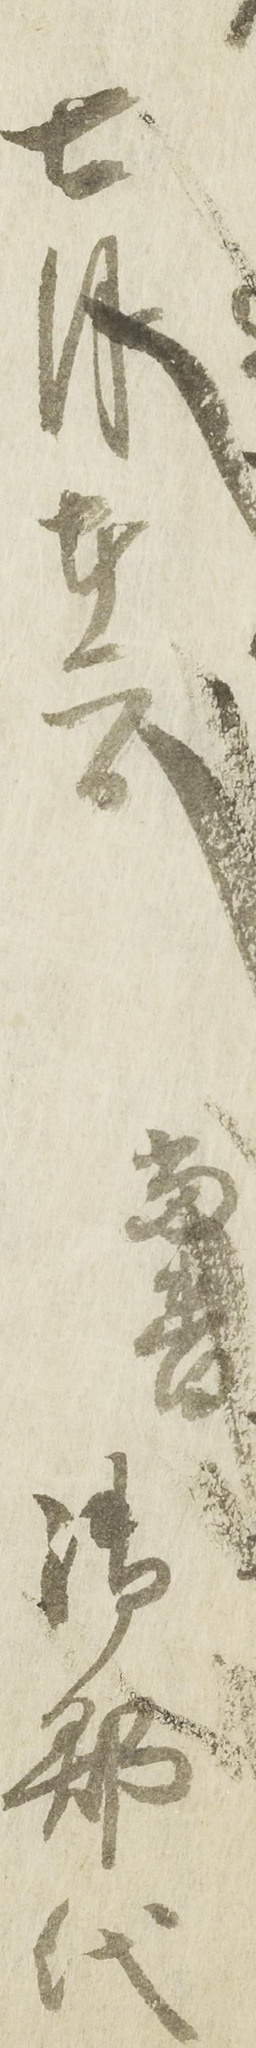七月廿二日当番御郡代

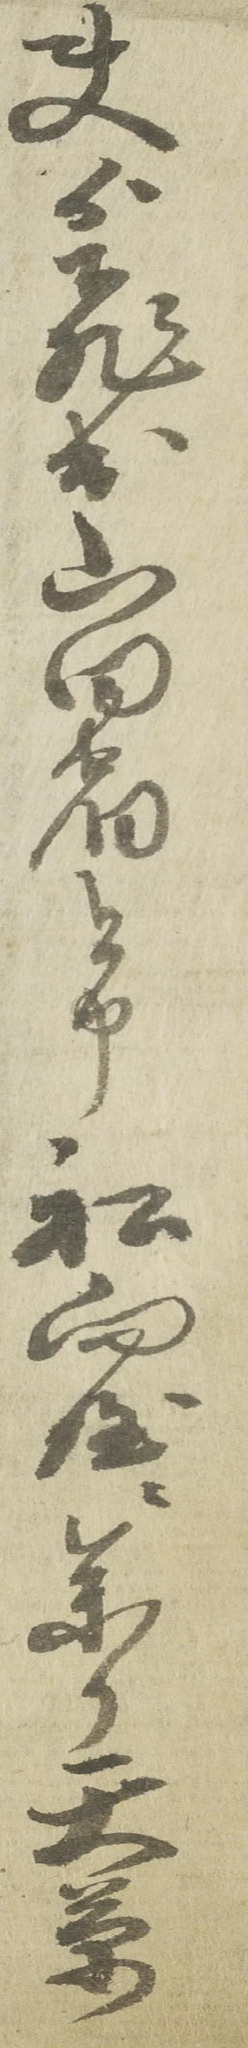夫ゟ飛出山田宿と申舩向屋ニ参り天草
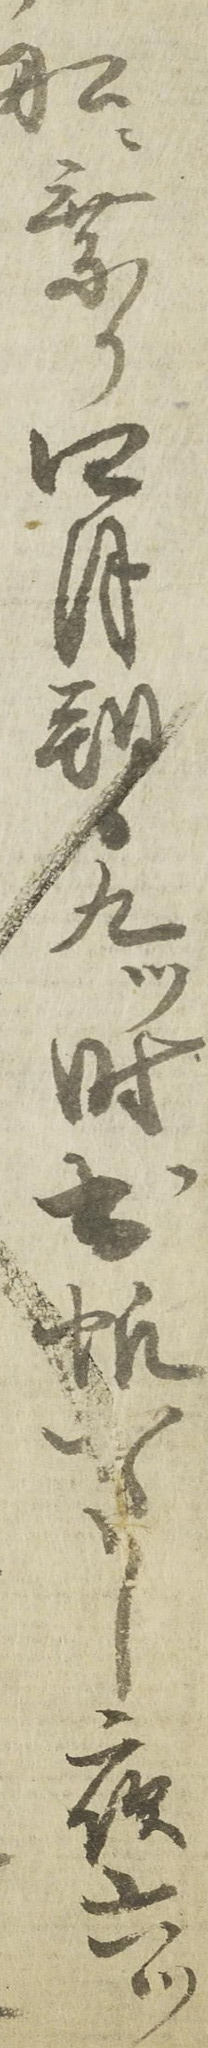舩ニ乗り四月朔日九ツ時出帆いたし夜六ツ
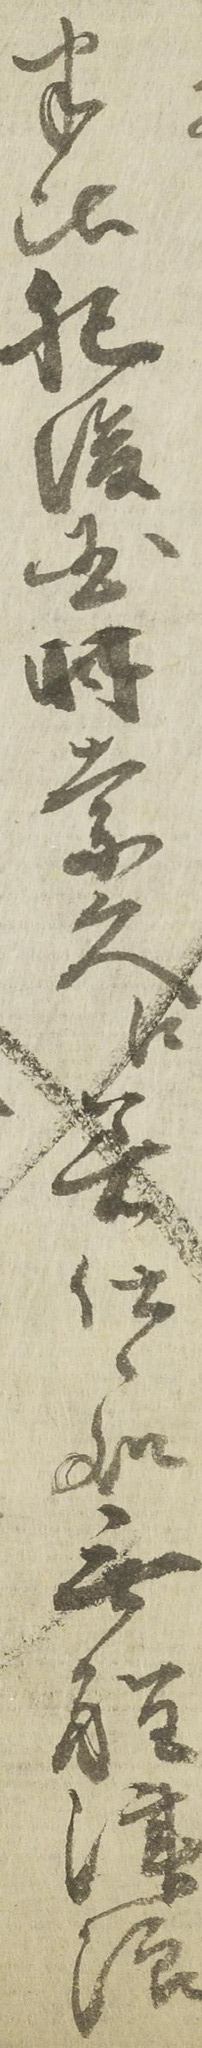半頃肥後国日奈久江着仕候処無程津浪
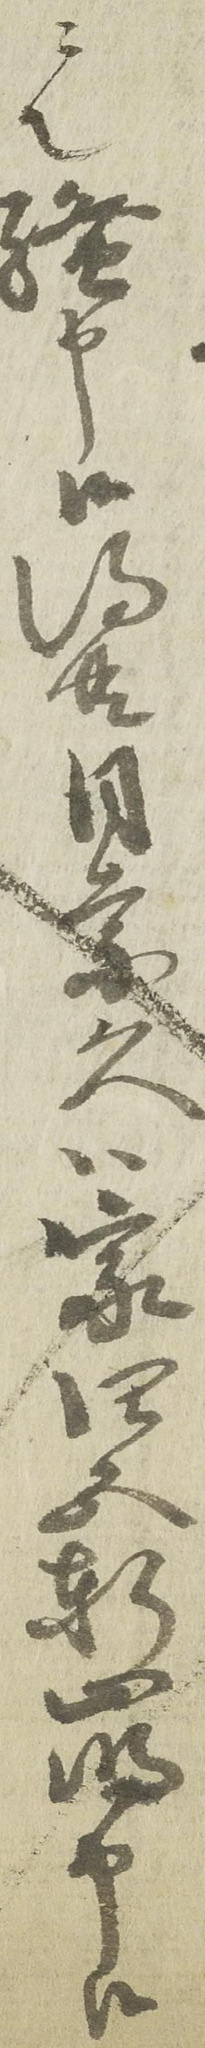ニて騒申候得共日奈久は家四五軒崩申候
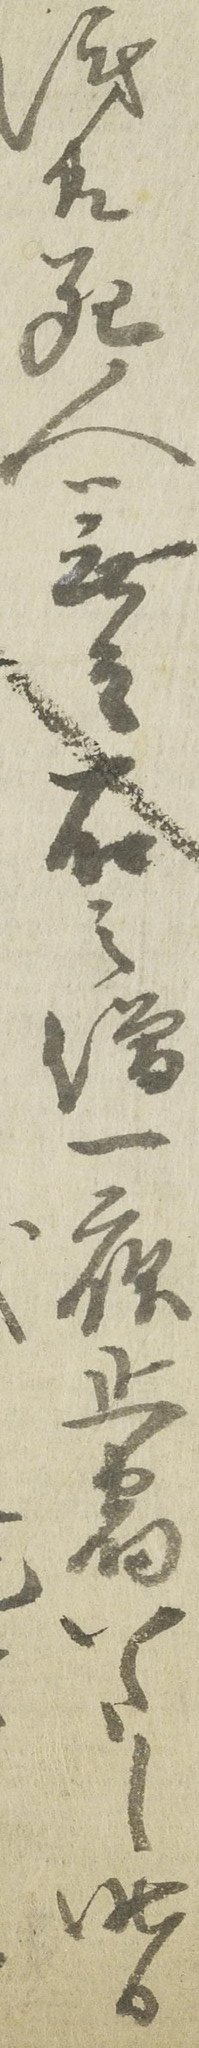得共死人は無之右之僧一夜止宿いたし昨日
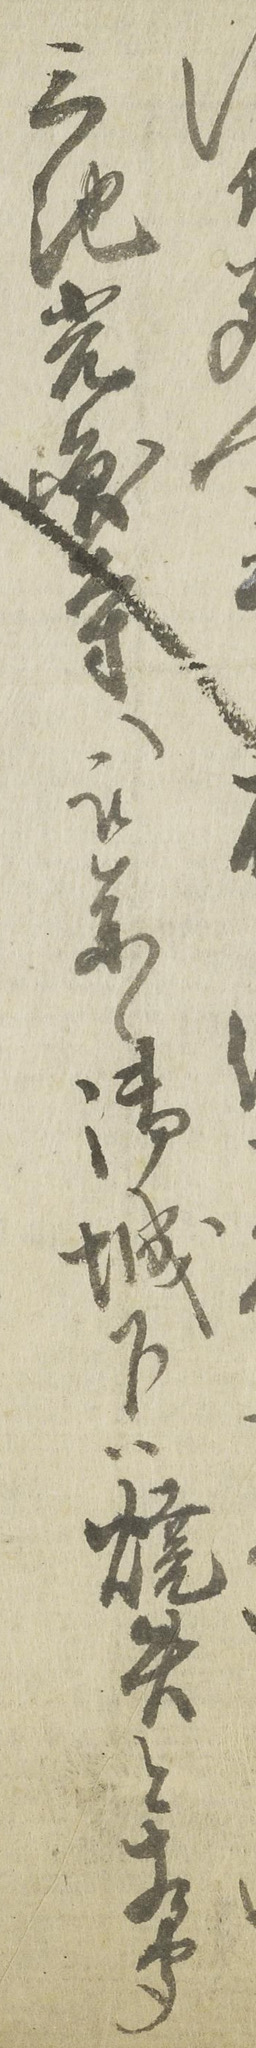三池光円寺へ被参候御城下は焼失と相聞
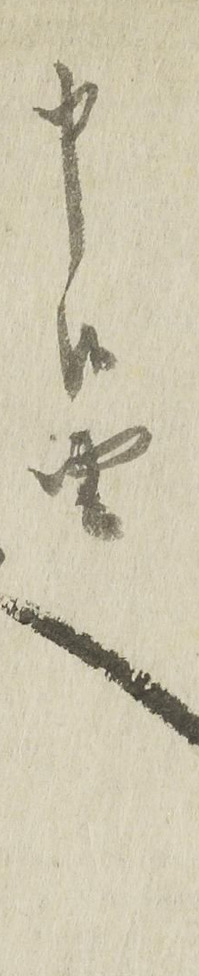申候由
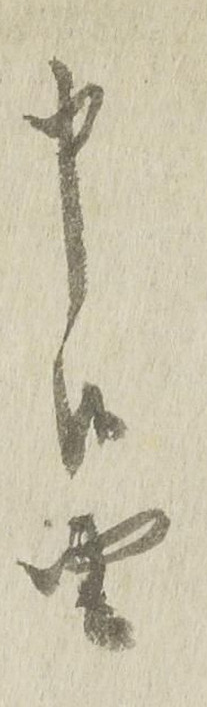申候由
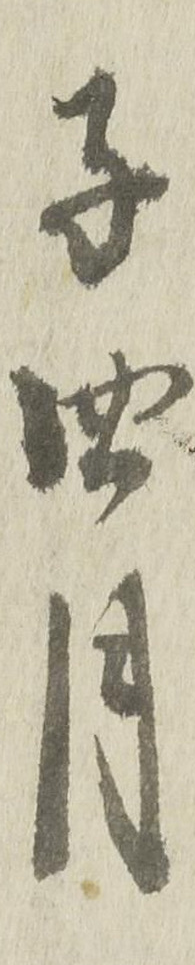子四月
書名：後見笑
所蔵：東京大学地震研究所図書室 Earthquake Research Institute Library, The University of Tokyo, JAPAN
